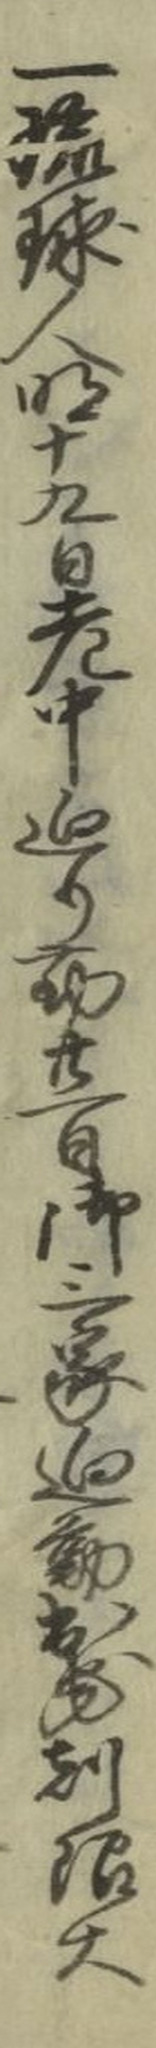一琉球人明十九日老中廻り勤廿一日御三家廻勤出宅刻限大
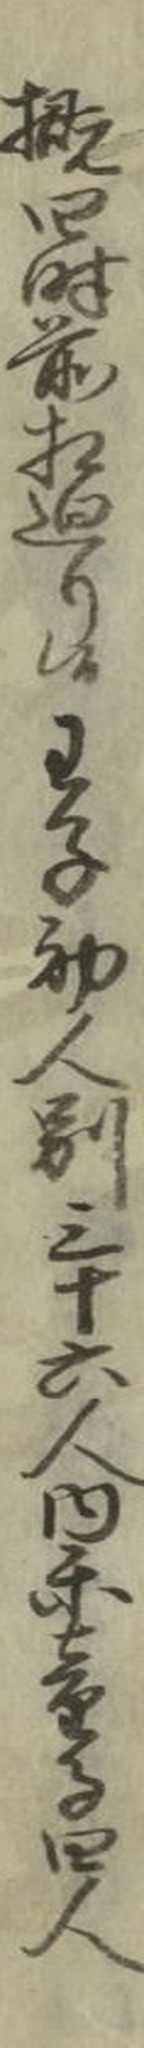概四時前相廻り候王子初人別三十六人内楽童子四人
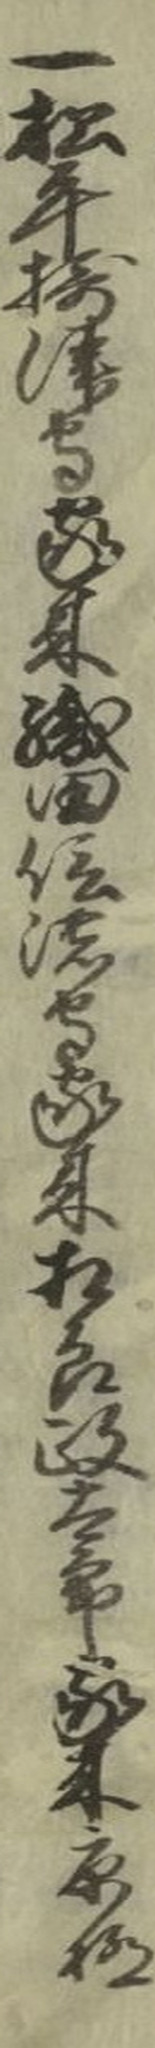一松平摂津守家来織田信濃守家来相良政太郎家来京極
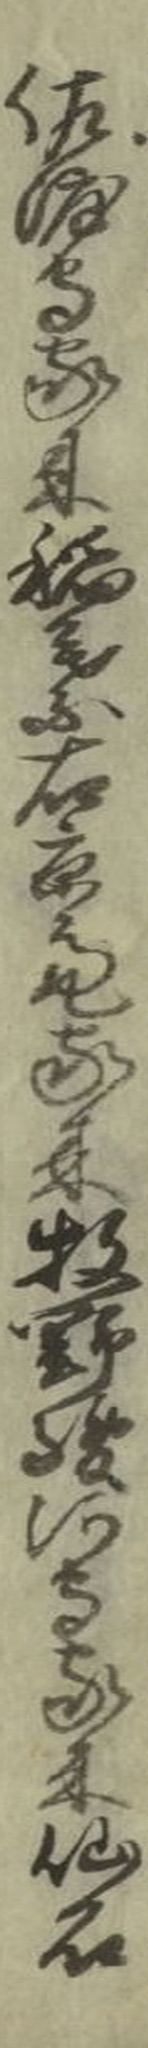佐渡守家来稲葉右京亮家来牧野駿河守家来仙石
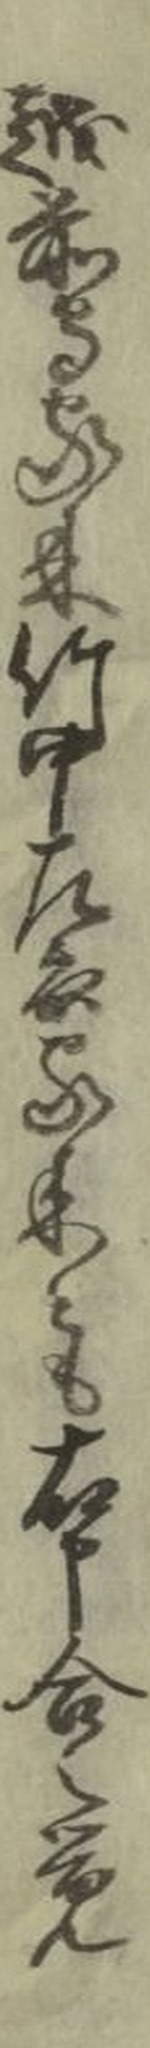越前守家来備中左京家来とも右申合之覚
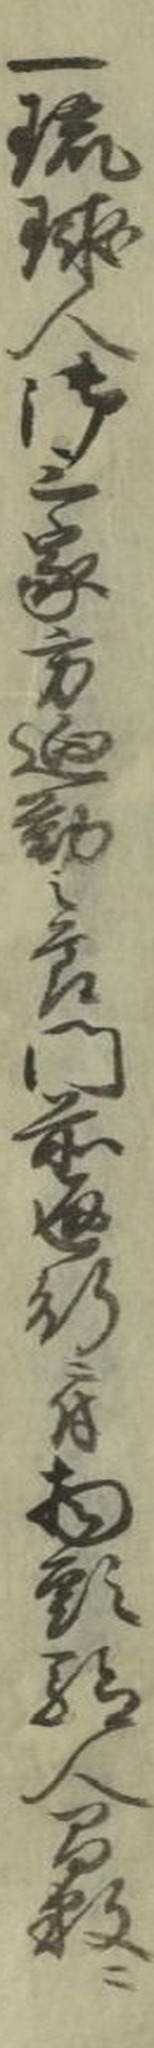一琉球人御三家方廻勤之節門前通行に付物頭給人員数に
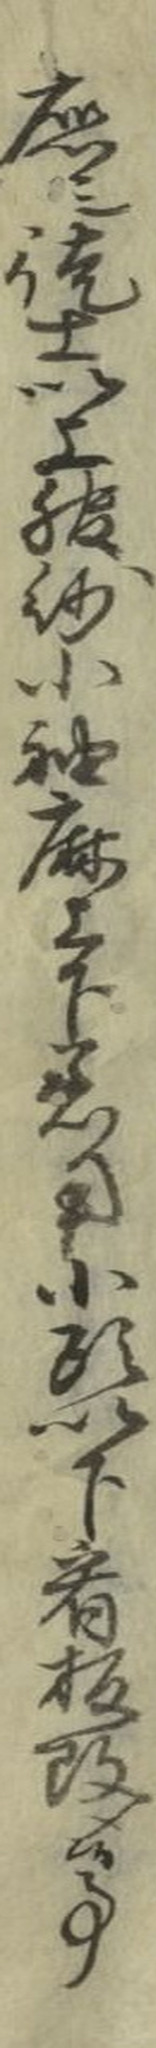応シ徒士以上服紗小袖麻上下着用小頭以下看板改候事
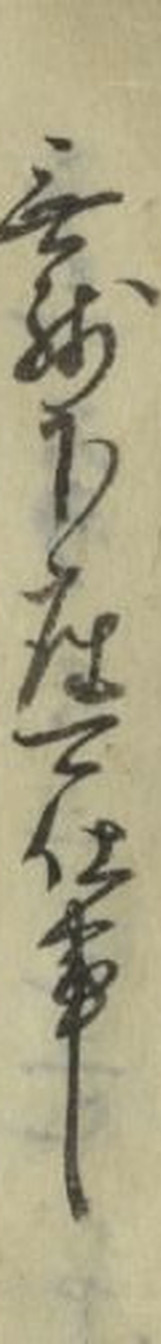無残下座可仕事
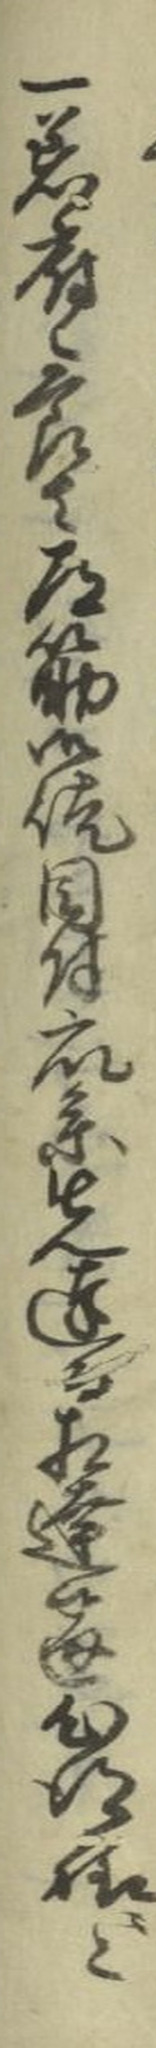一着府之節は道筋御徒目付衆参先達而相達候通心得様にと
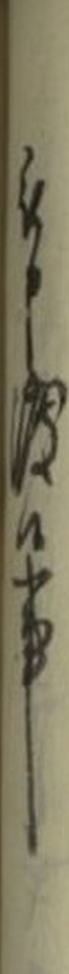被申渡候事
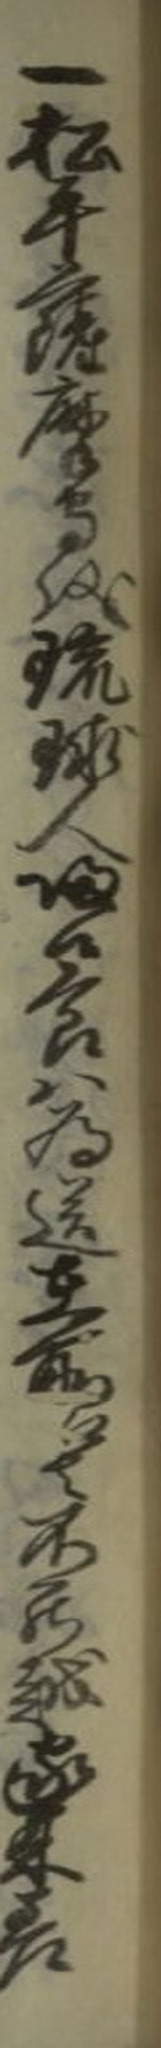一松平薩摩守儀琉球人帰候節は為送在所えは不罷越家来差
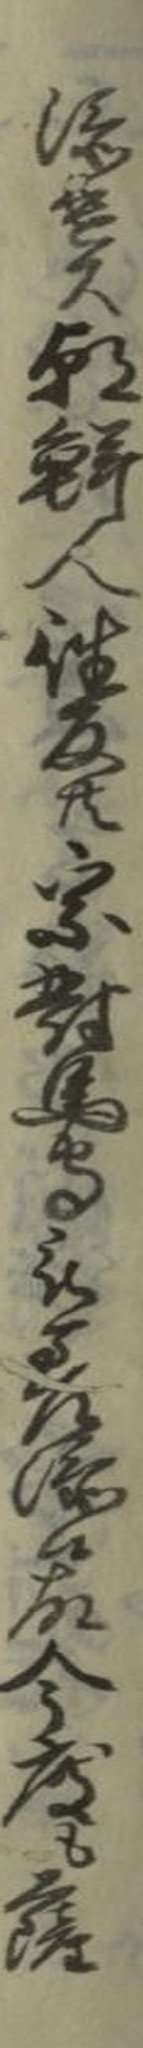添朝鮮人往反共宗對馬守被差添候故今度も薩
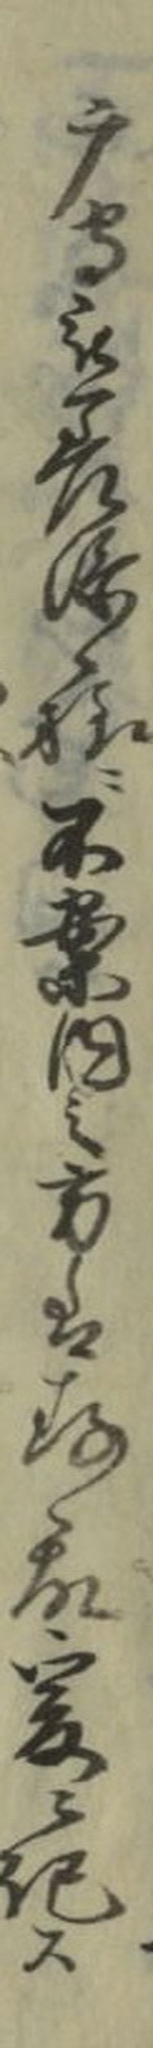摩守被差添候様に不案内之方は存候故爰に記す
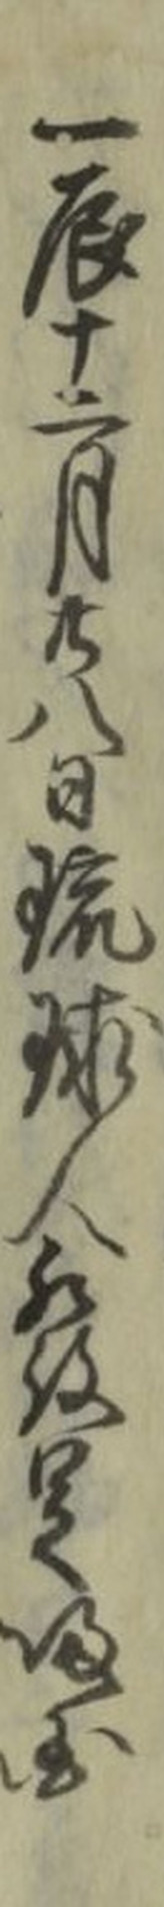一辰十二月十八日琉球人発足帰国
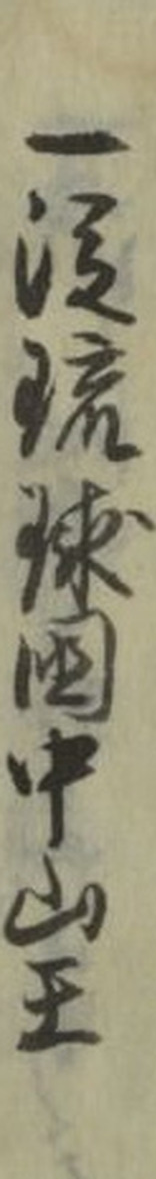一従琉球国中山王
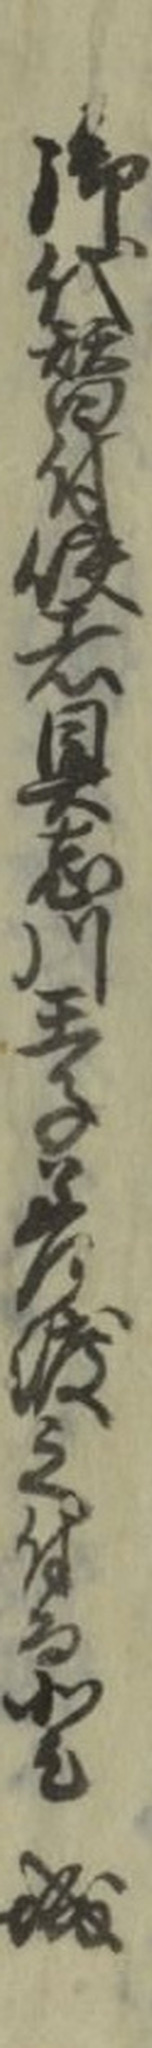御代替に付使者具志川王子差渡之付而登城
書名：琉球人来朝之記
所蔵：University of the Ryukyus Library
